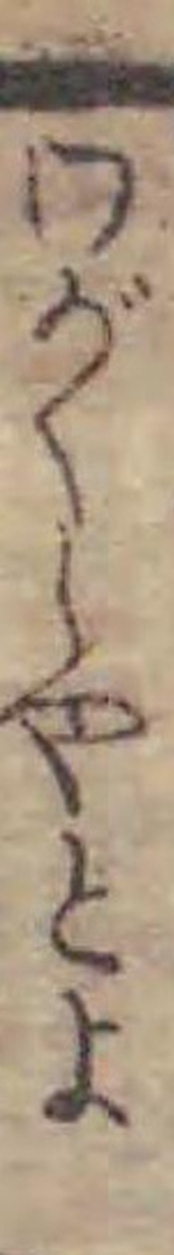わがくしやとよ
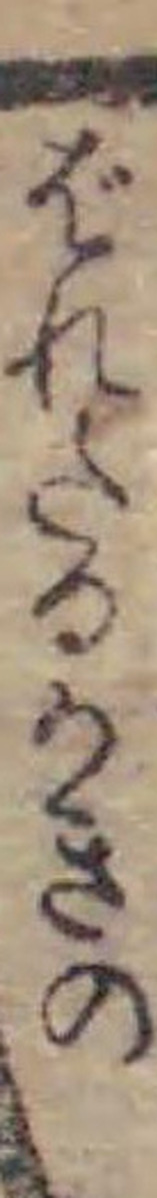ばれたるかきの
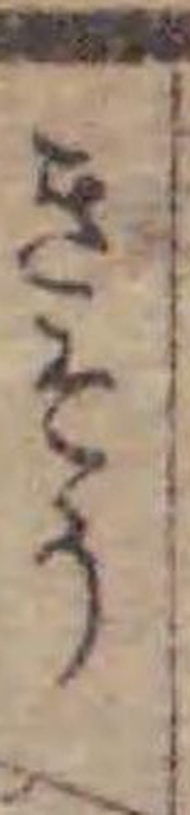きそう
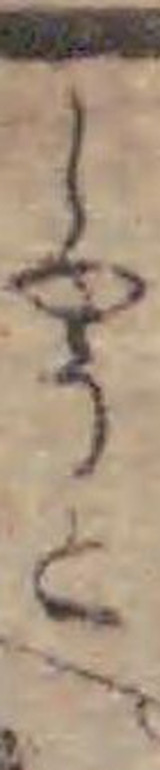しやうと

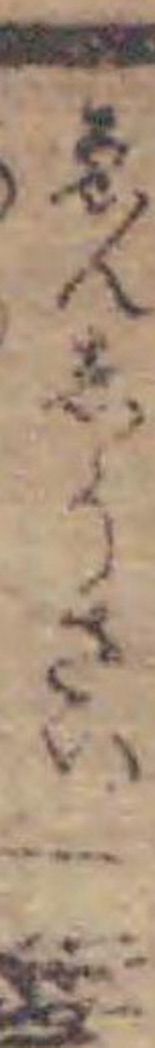ゑんしうさい
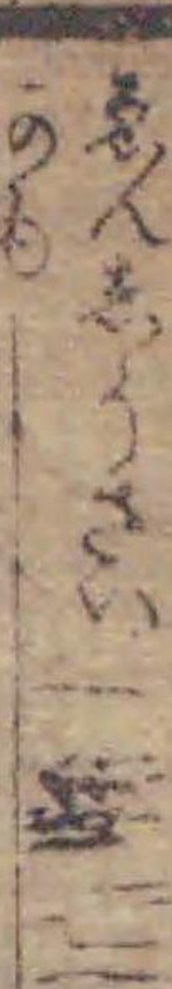ゑんしうさい
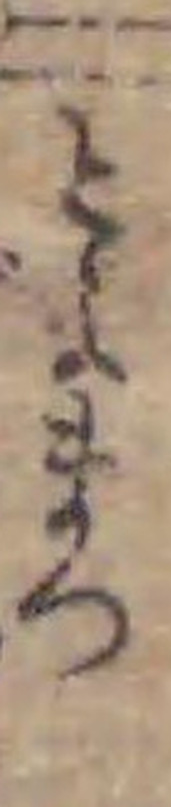とよまつ
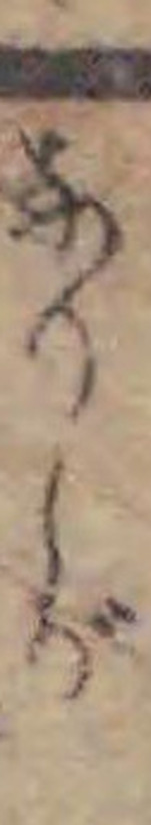なりしが
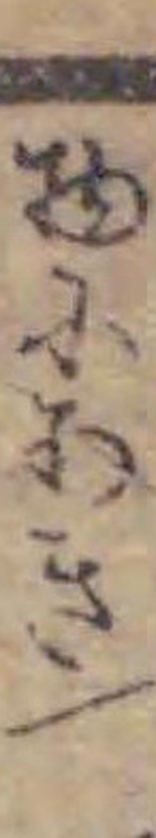物にあき
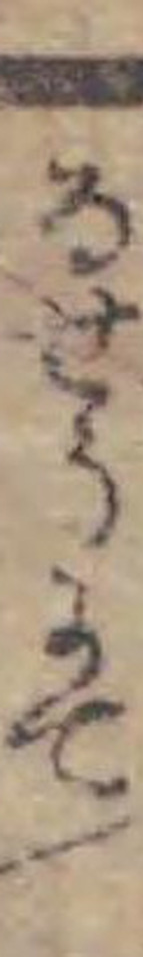るせうにて
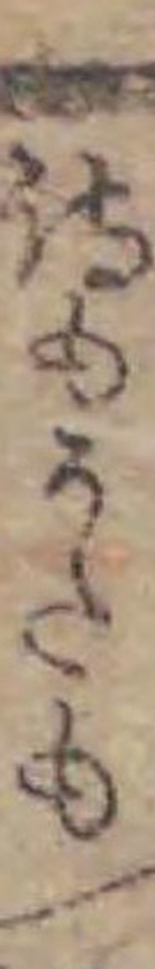詩もうたも
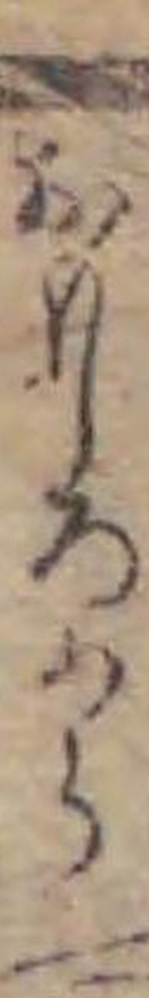おもしろから
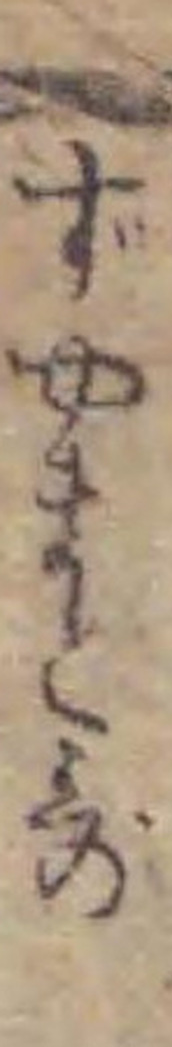ずやまと哥
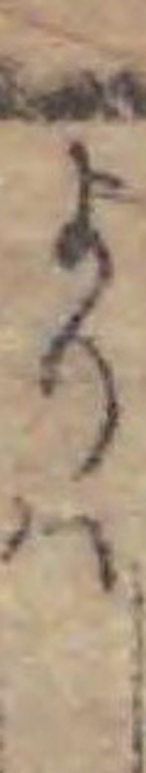よりは
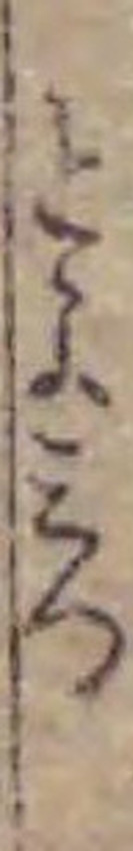とよみつ
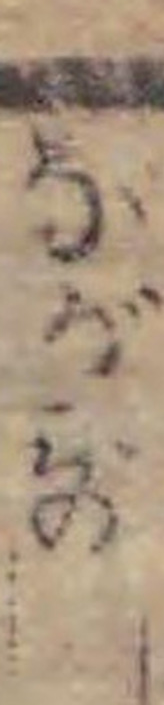なが哥
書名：此奴和日本 : 2巻
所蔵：国立国会図書館 National Diet Library, JAPAN
